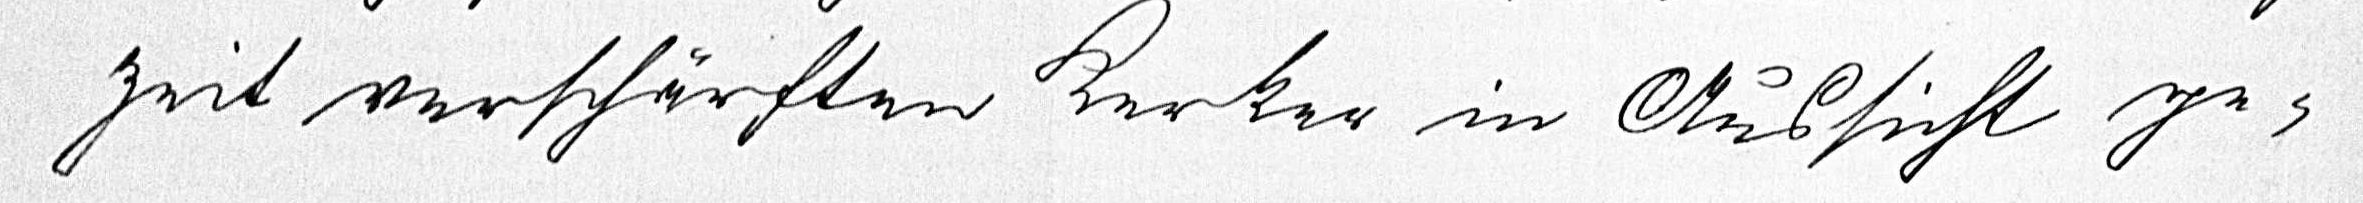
zeit verschärften Kerker in Aussicht ge¬
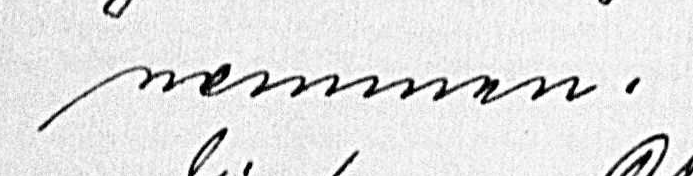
nommen.
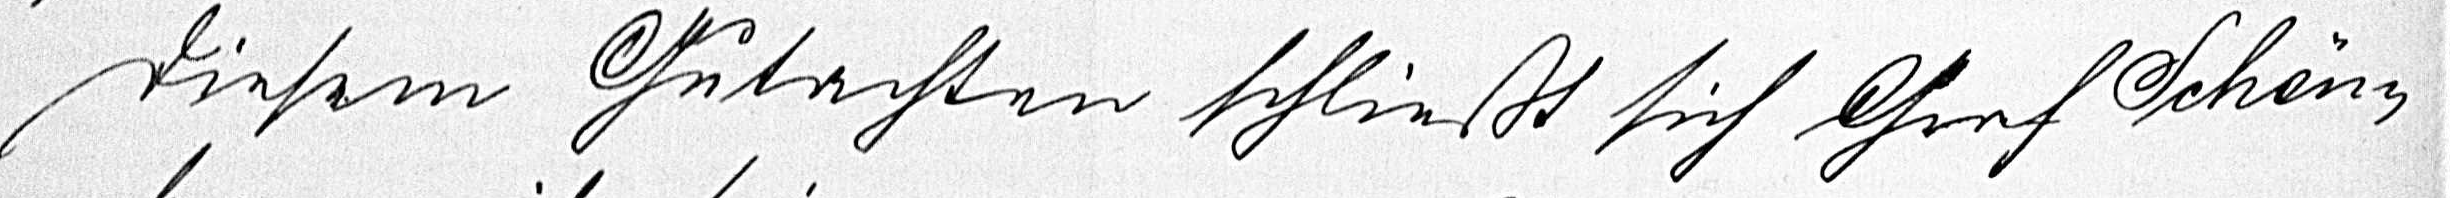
Diesem Gutachten schließt sich Graf Schön¬
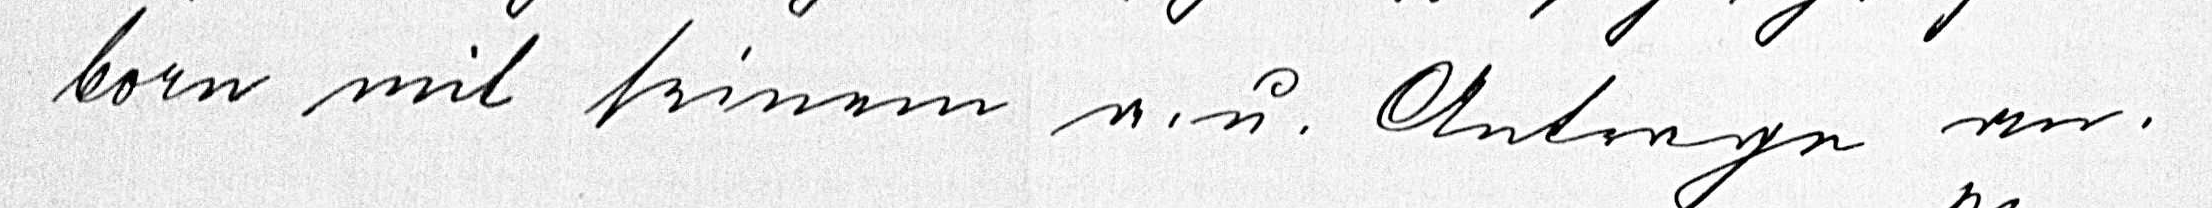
born mit seinem a.u. Antrage an.
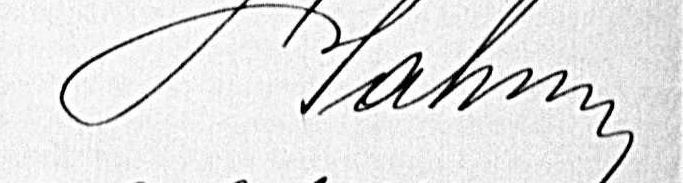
Hahn
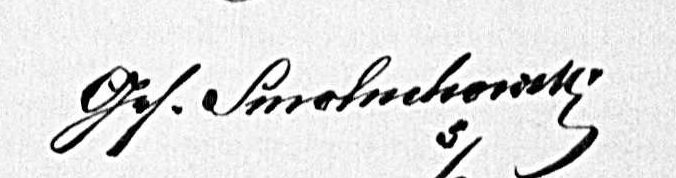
Grf Smolenkowski
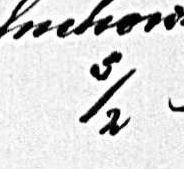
3/2
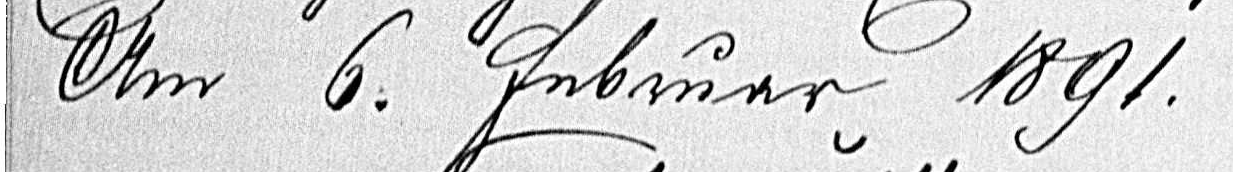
Am 6. Februar 1891
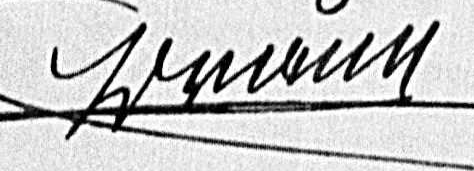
Wrany
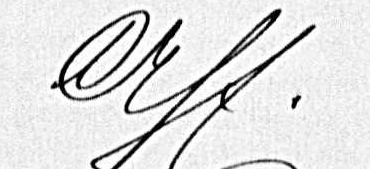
AhE.
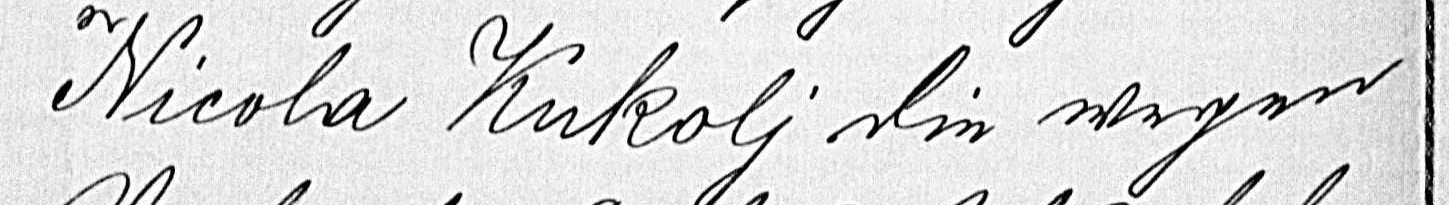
Nicola Kukolj die wegen
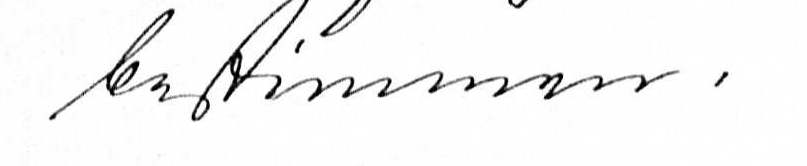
bestimmen.
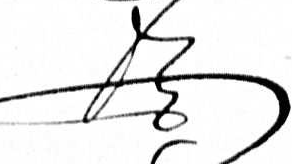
FJ
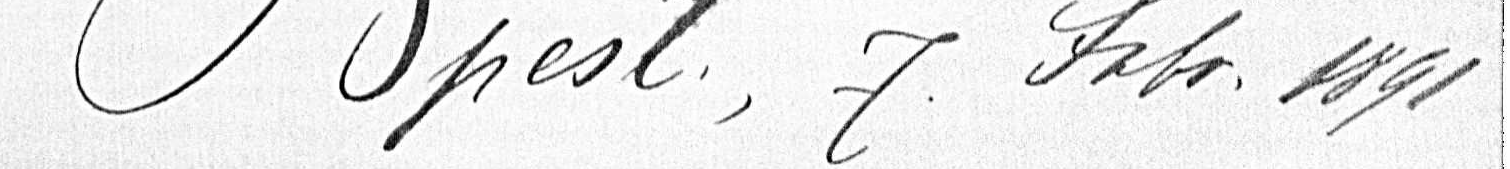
Bpest, 7 Feb 1891
